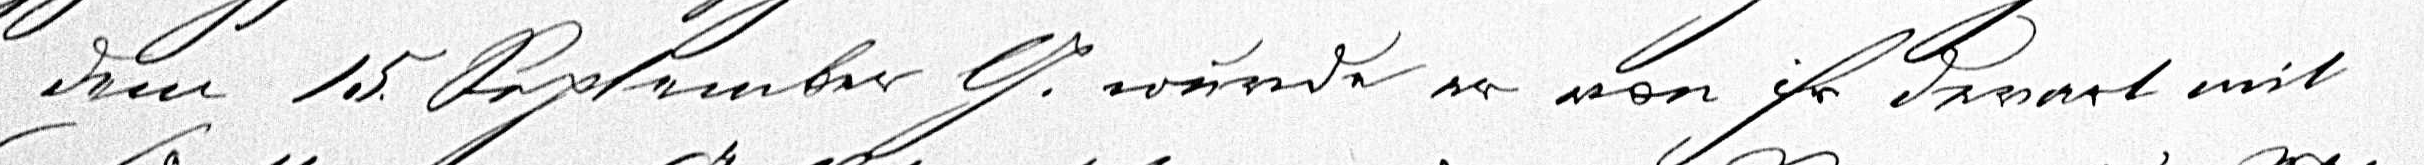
dem 15. September lJ wurde er von ihr derart mit
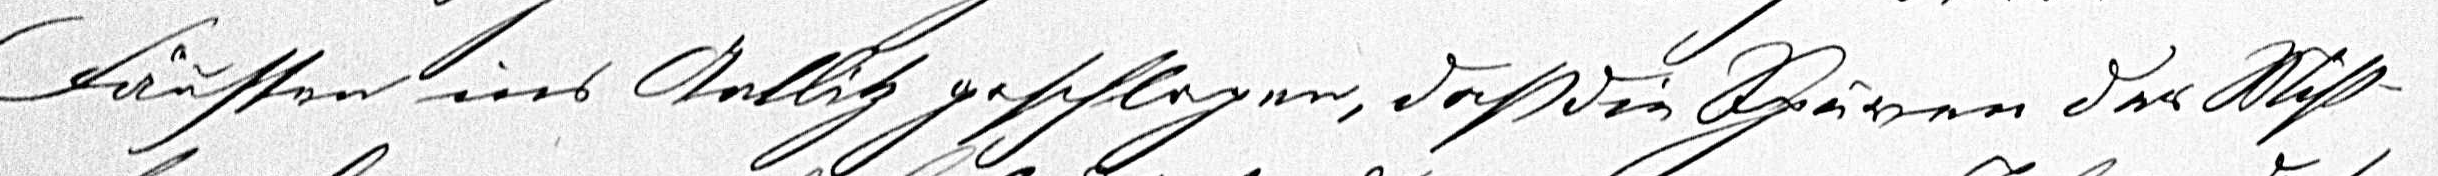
Fäusten ins Antlitz geschlagen, daß die Spuren der Miß¬
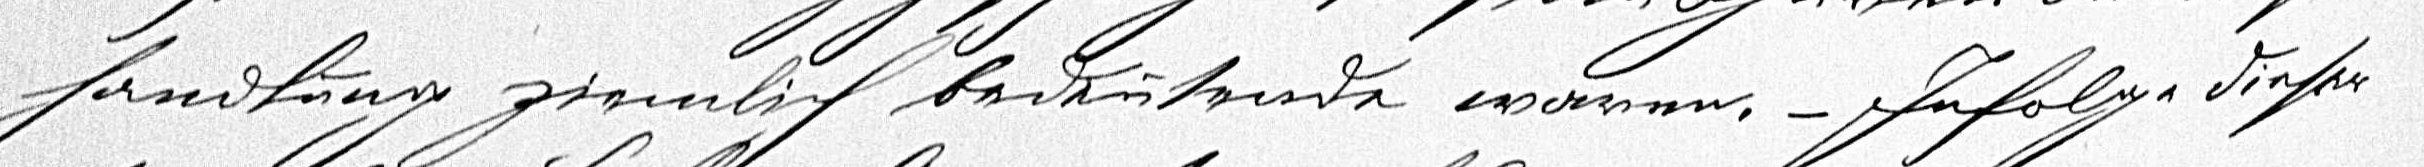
handlung ziemlich bedeutende waren. Infolge dieser
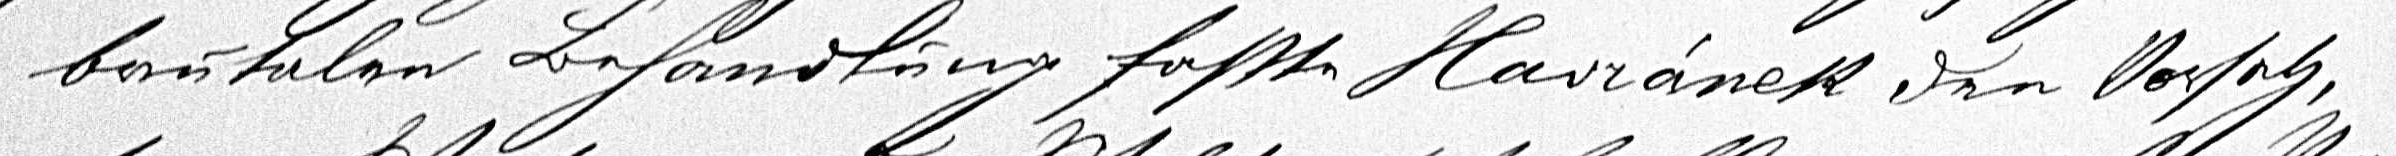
brutalen Behandlung faßte Havránek den Vorsatz,
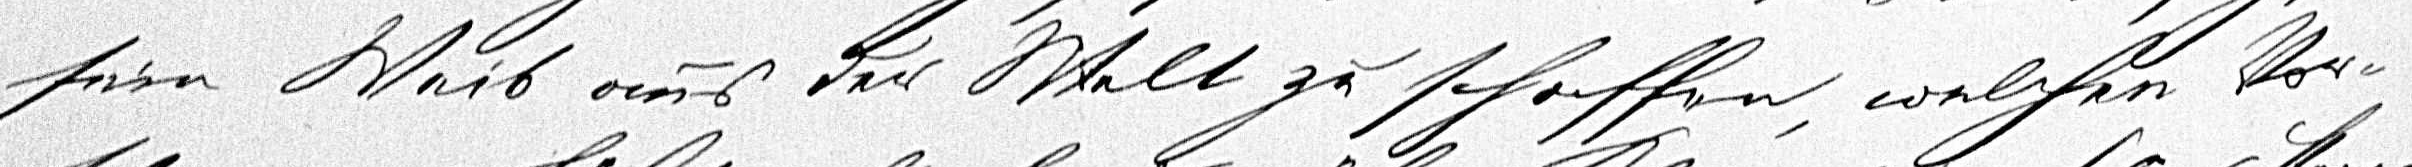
sein Weib aus der Welt zu schaffen, welchen Vor¬
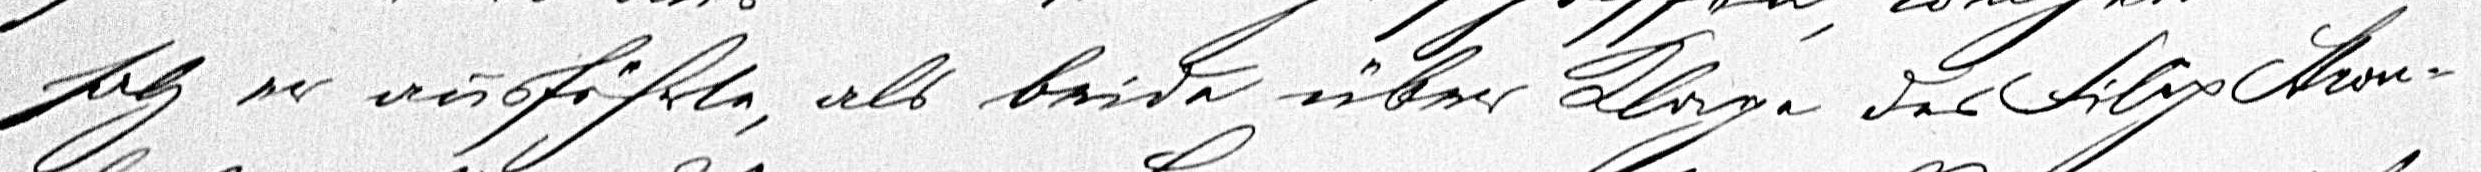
satz er ausführte, als beide über Klage des Filip Stro¬
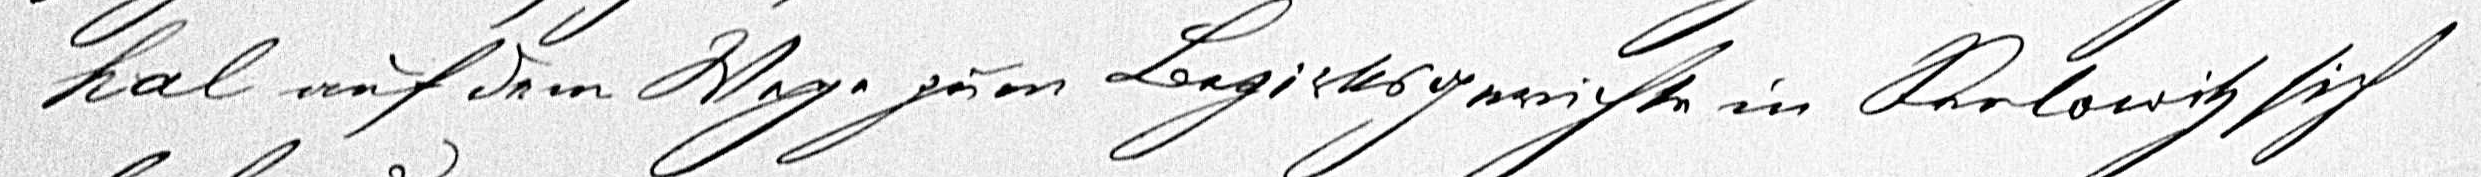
nal auf dem Wege zum Bezirksgerichte in Seelowitz sich
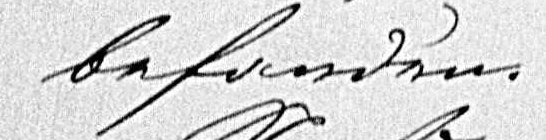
befanden.
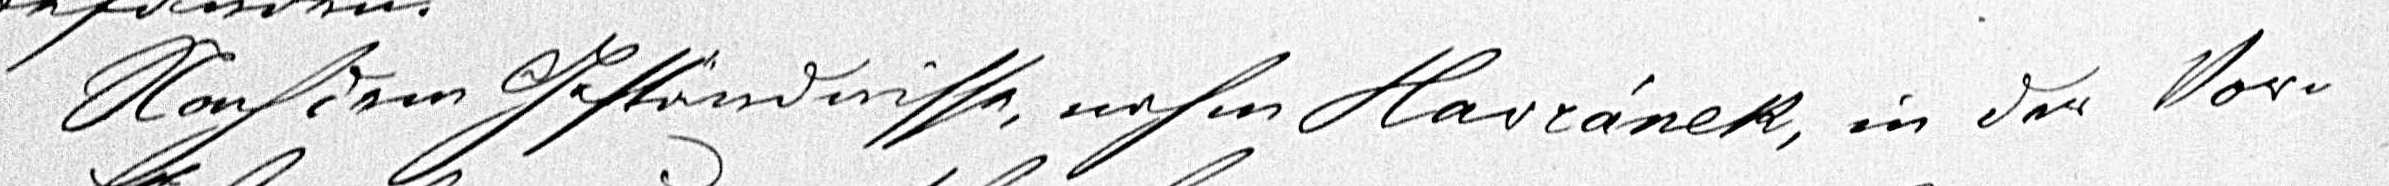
Nach dem Geständnisse, nahm Havránek, in der Vor¬
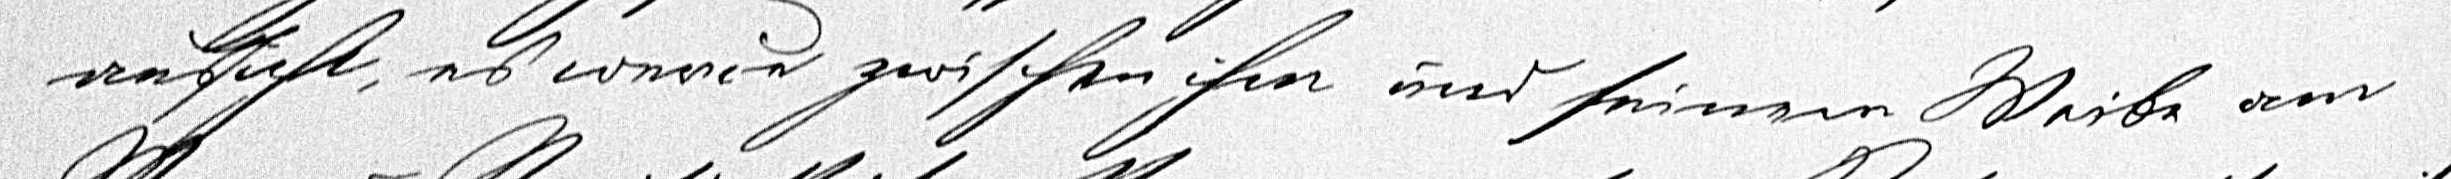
aussicht, es werde zwischen ihm und seinem Weibe am
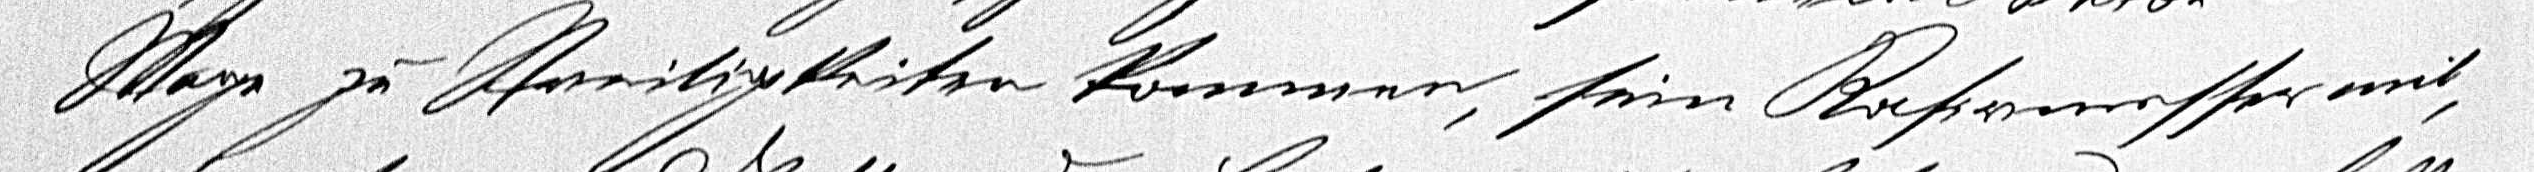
Wege zu Streitigkeiten kommen, sein Rasirmesser mit,
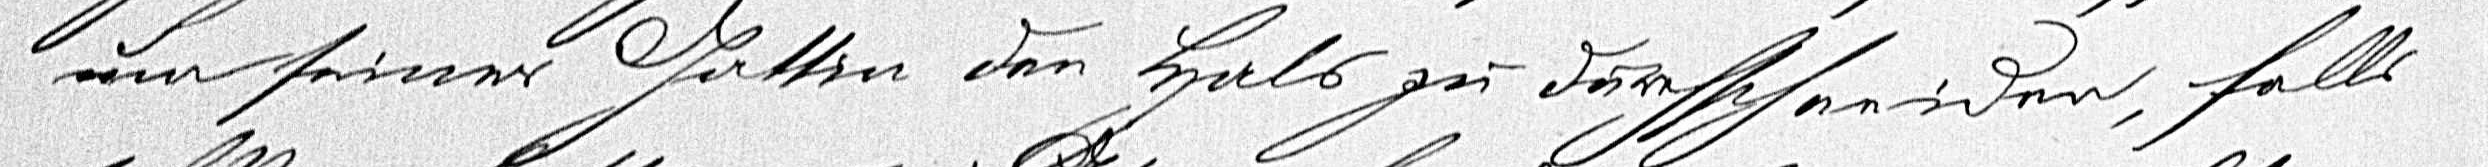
an seiner Gattin den Hals zu durchschneiden, falls
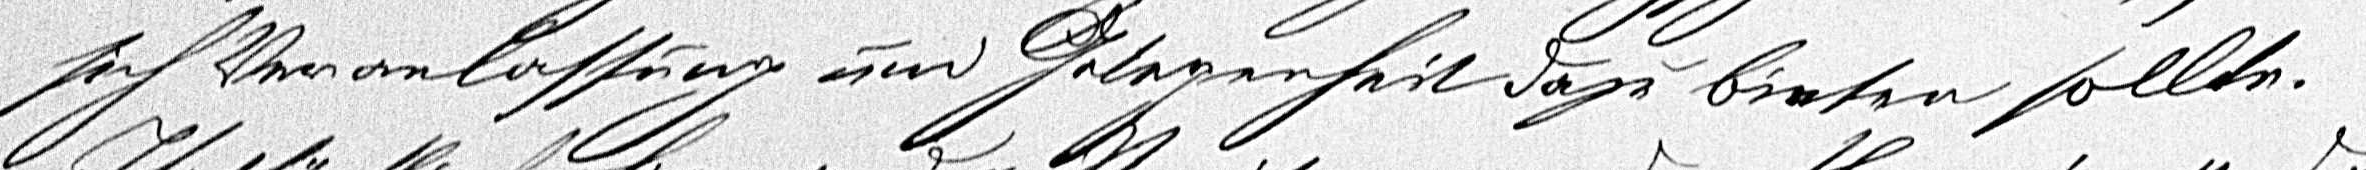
sich Veranlassung und Gelegenheit bieten sollte.
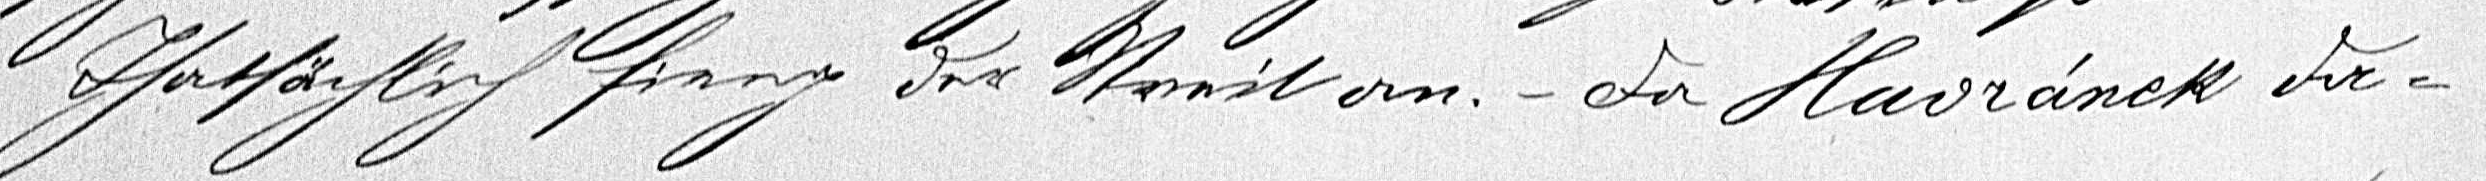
Thatsächlich fieng der Streit an. Da Havránek da¬
